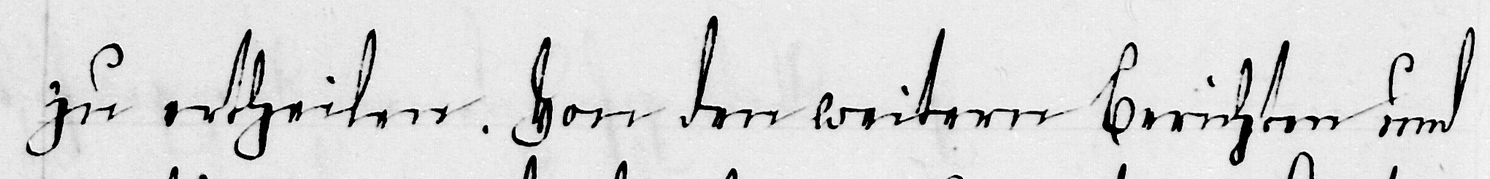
zu ertheilen. Von den weitern Berichten und
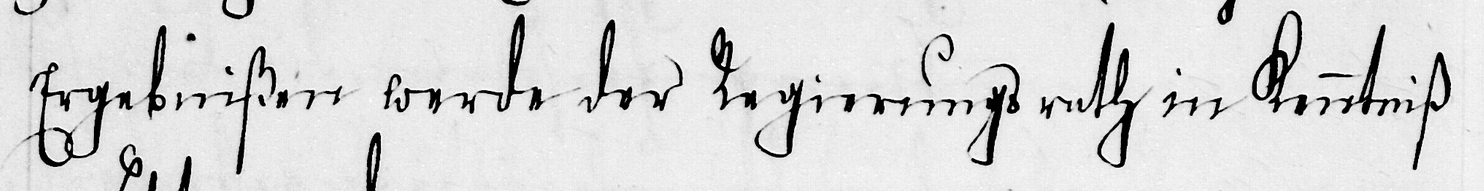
Ergebnißen werde der Regierungsrath in Kenntniß
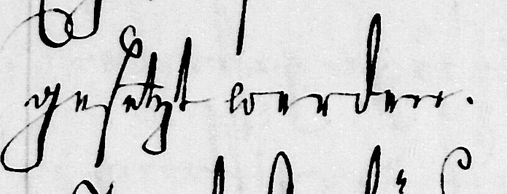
gesetzt werden.
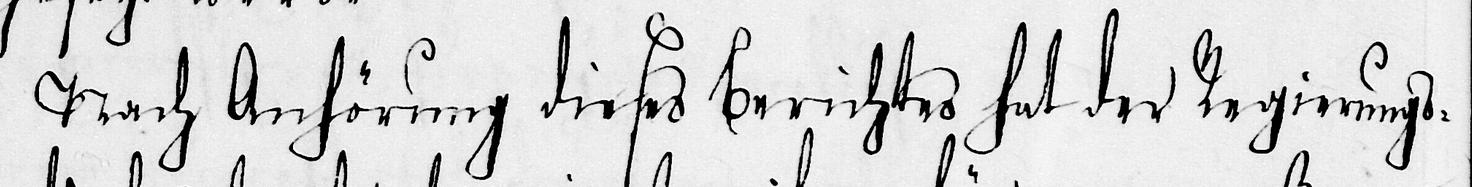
Nach Anhörung dieses Berichtes hat der Regierungs¬
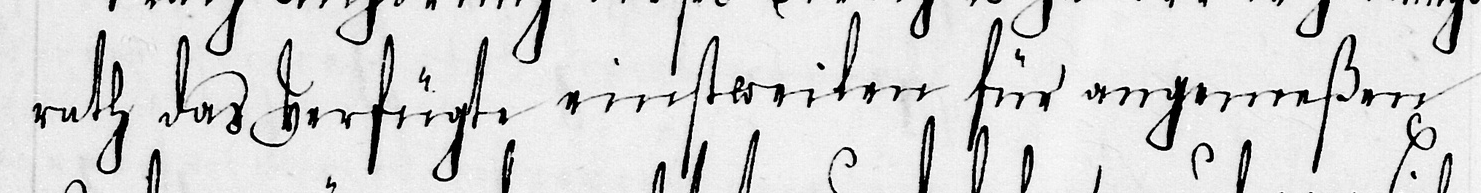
rath das Verfügte einstweilen für angemeßen
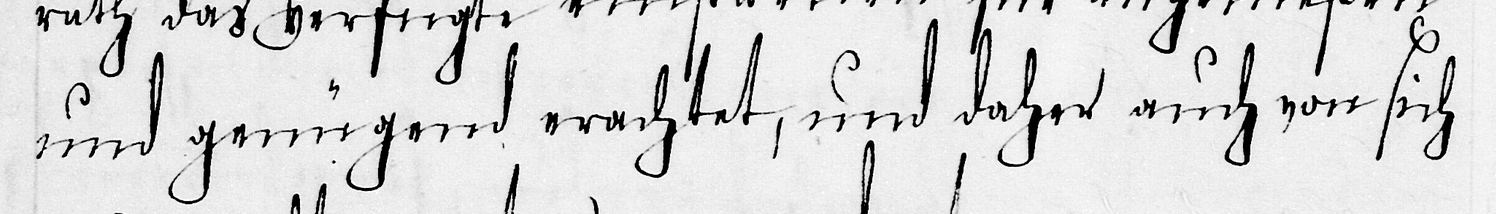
und genügend erachtet, und daher auch von sich
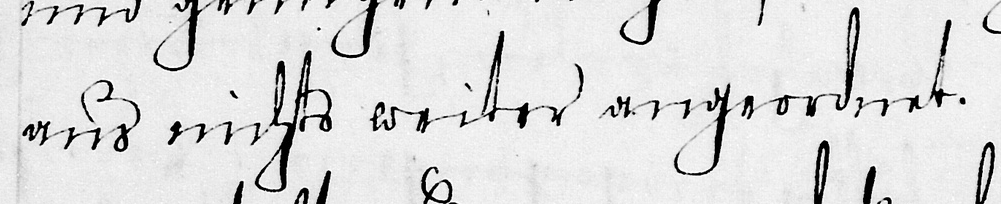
aus nichts weiter angeordnet.
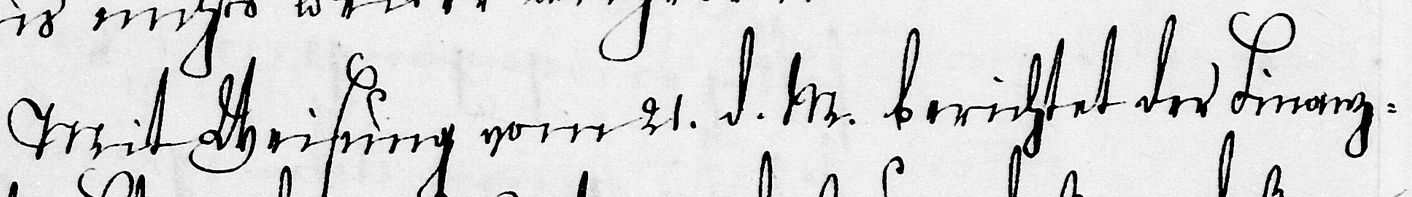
Mit Weisung vom 21. d. M. berichtet der Finanz¬
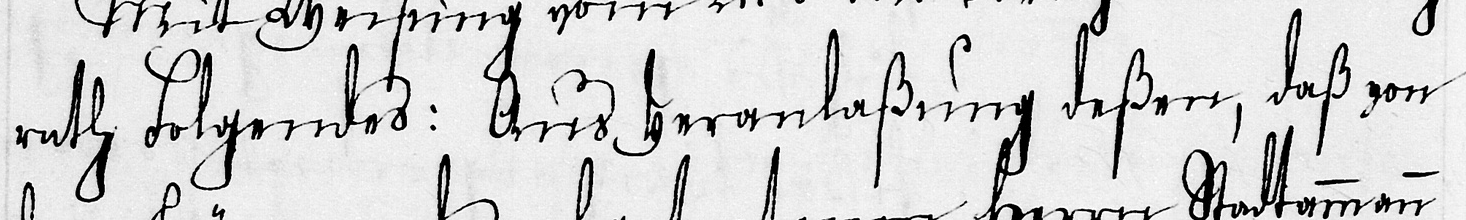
rath Folgendes: Aus Veranlaßung deßen, daß von
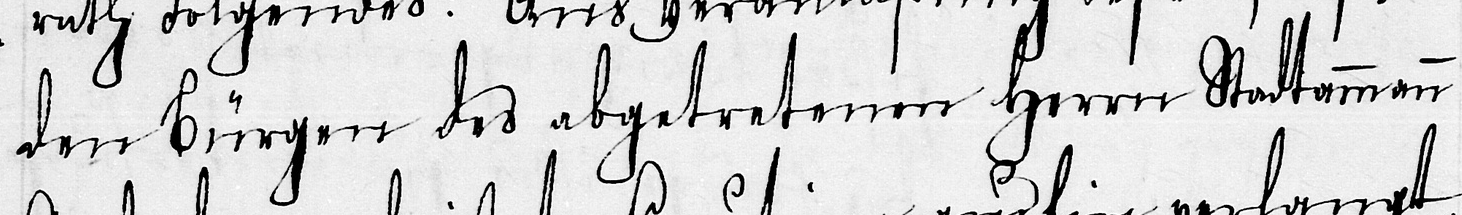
den Bürgern des abgetretenen Herrn Stadtamman¬
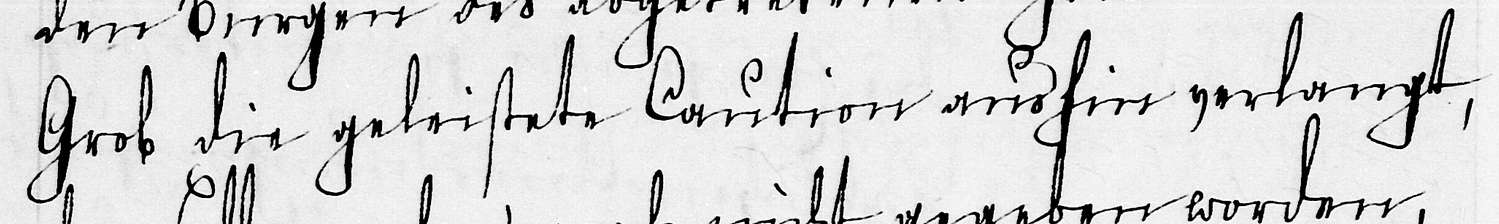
Grob die geleistete Caution aushin verlangt,
